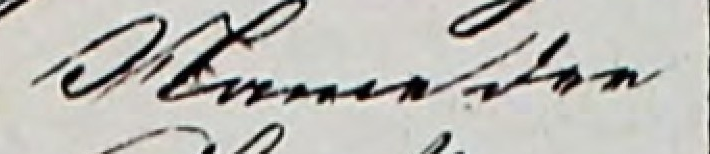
Name der
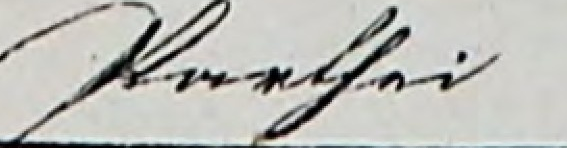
Parthei
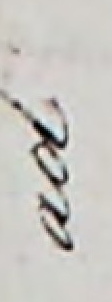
ad
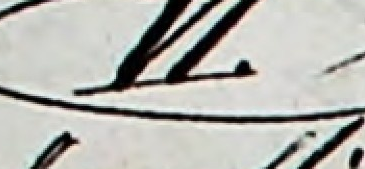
VI.
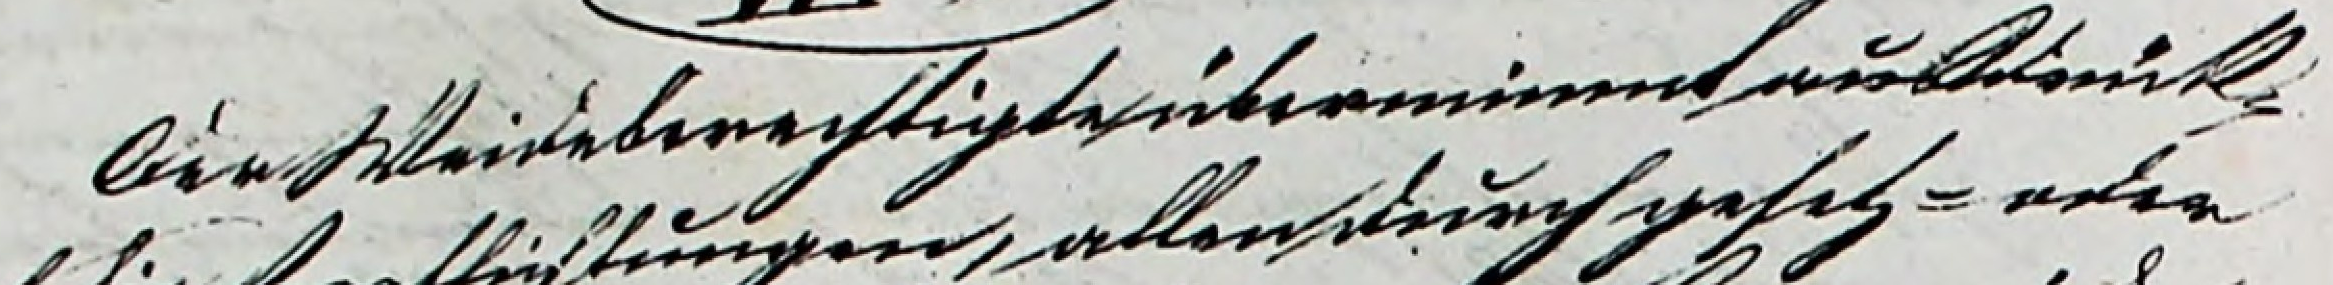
Der Weideberechtigte übernimmt ausdrück„
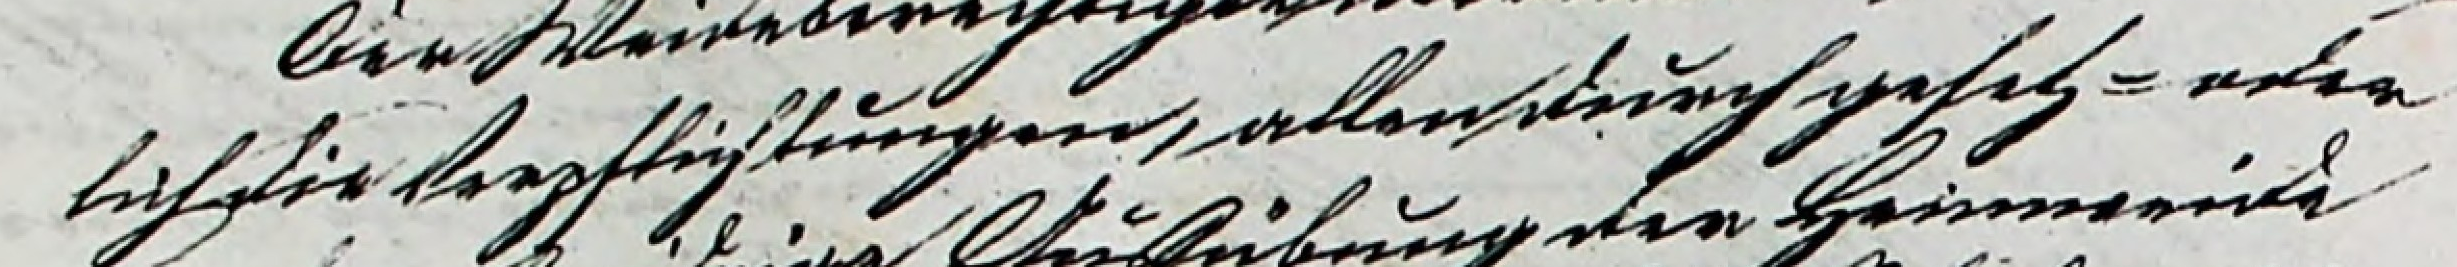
lich die Verpflichtungen, allen durch gesetz = oder
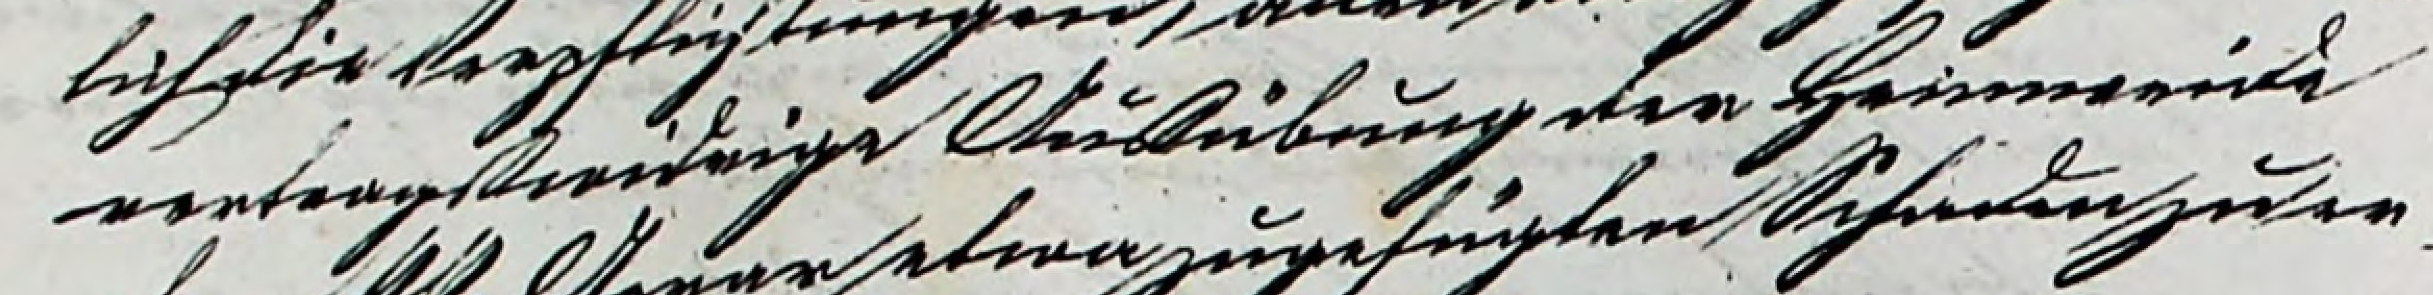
vertragswidrige Ausübung der Heimweide
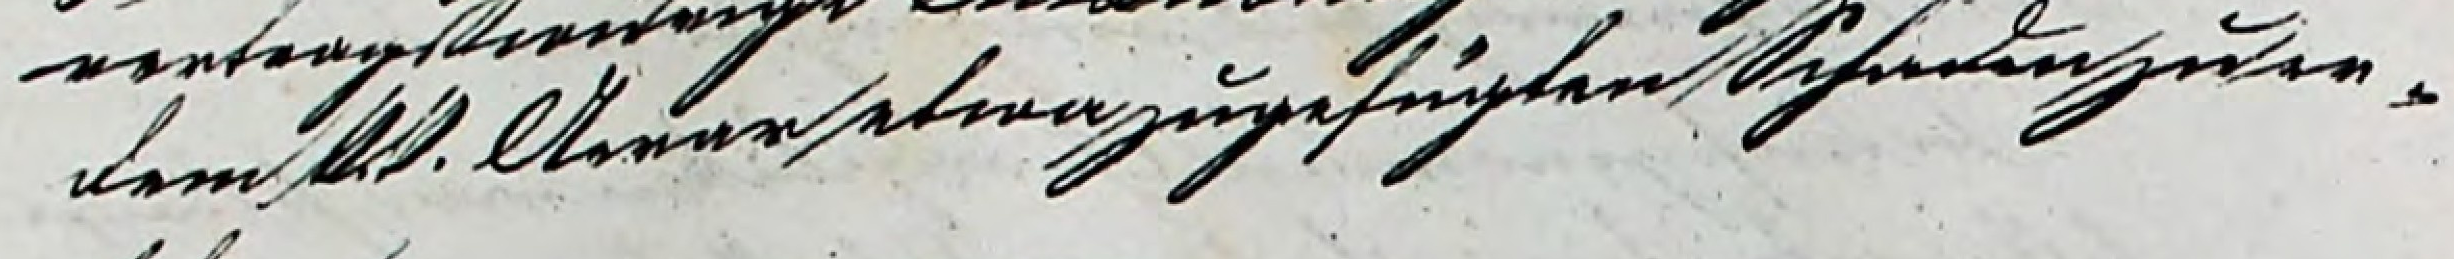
dem k.k. Aerar etwa zugefügten Schaden zu er„
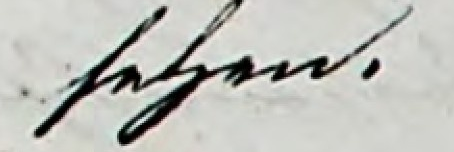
setzen.
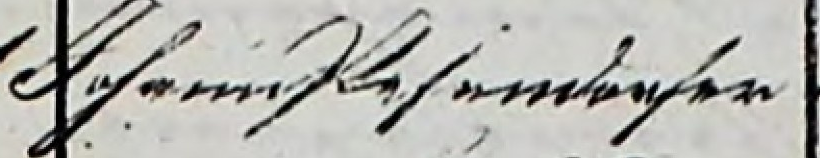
Johann Pesendorfer
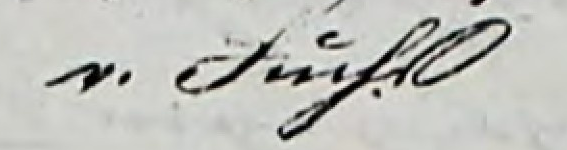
v. Fuchs
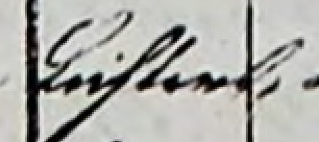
Lichters„
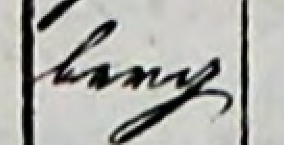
berg
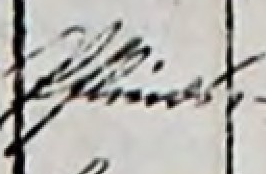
Pflinds„
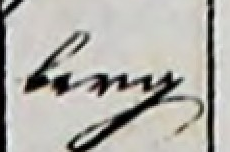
berg
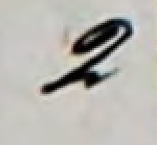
2
